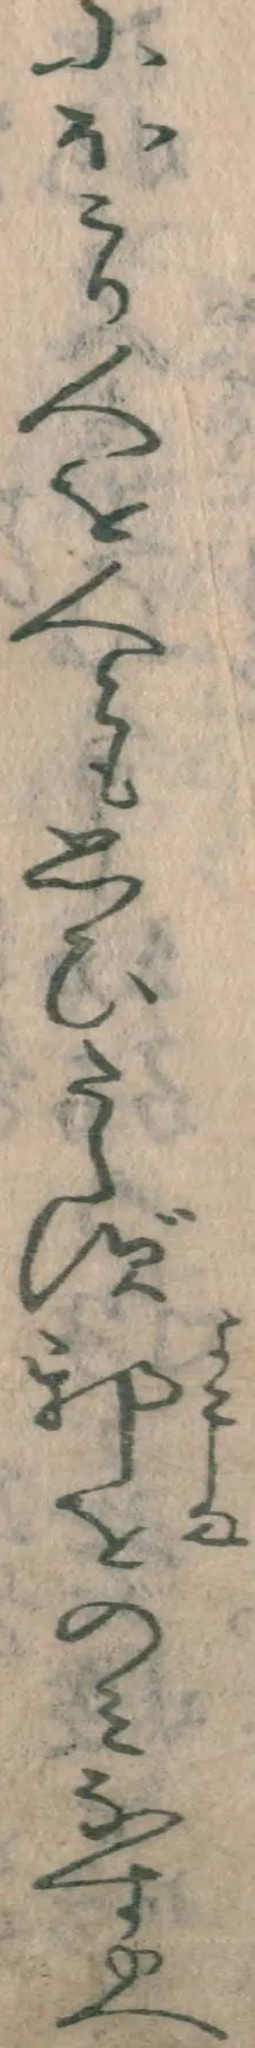にほこり人を人とも思ひたらず邪をのみなすゆへ
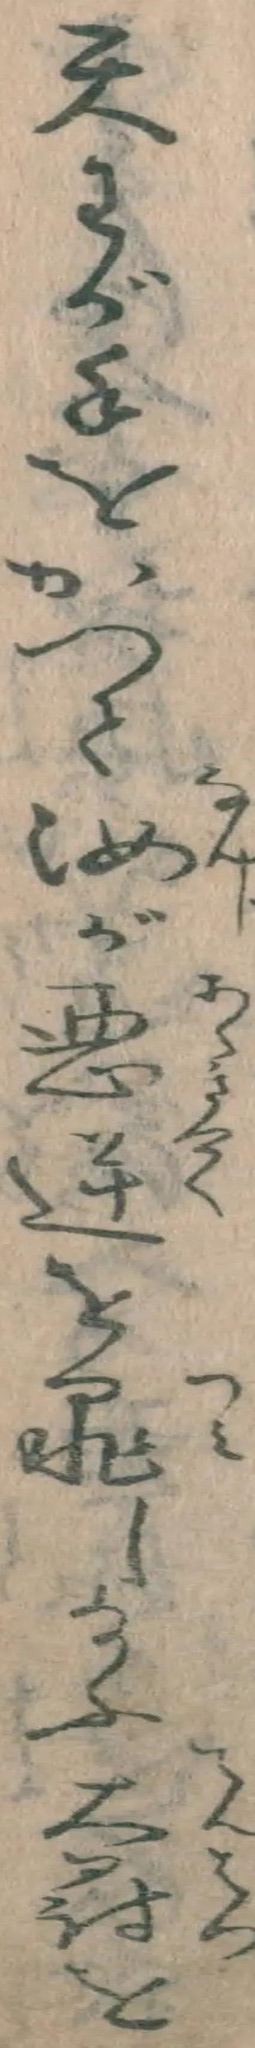天わが手をかつて汝が悪逆を罪し給ふ天罰を

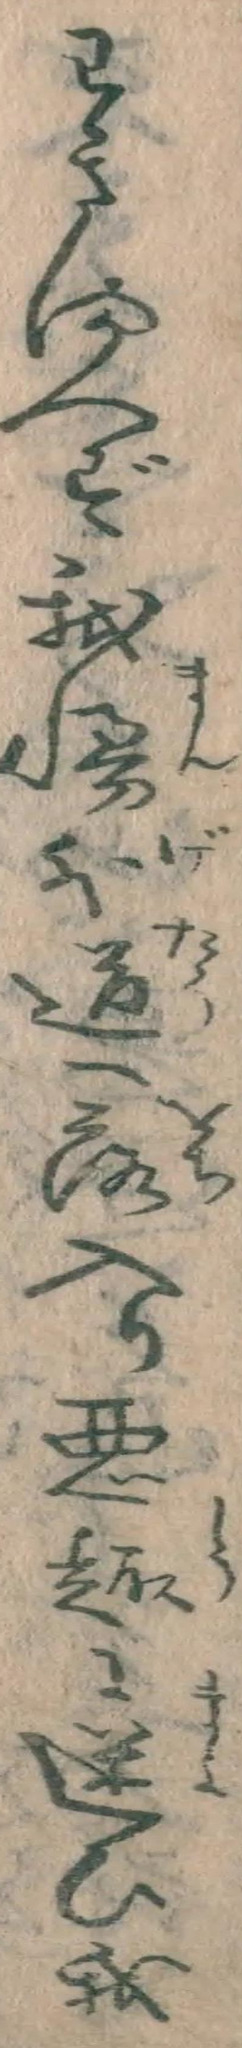わきまへず我慢外道へ落入り悪趣に迷ひ我
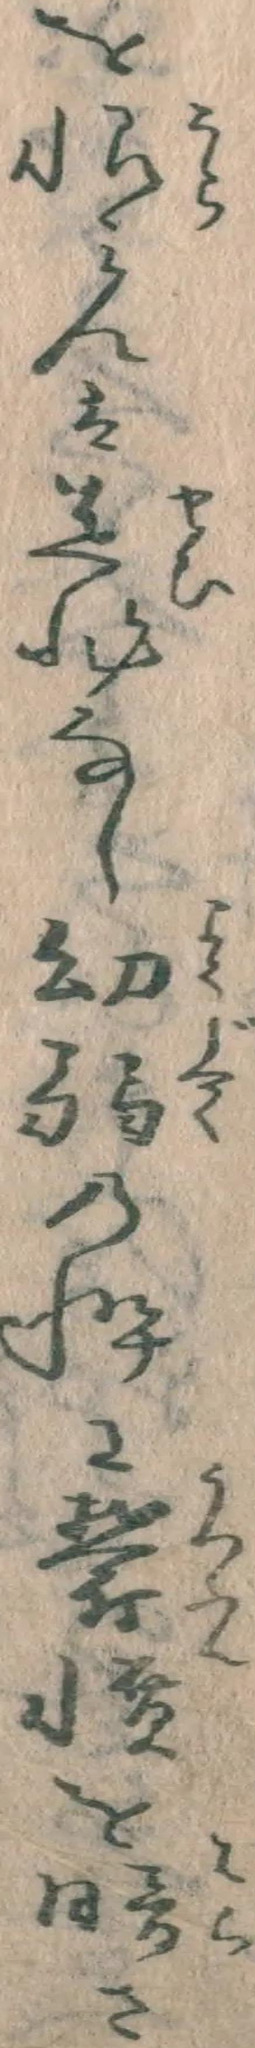を恨みんは是非なし幼弱の伜に鬱憤を晴さ
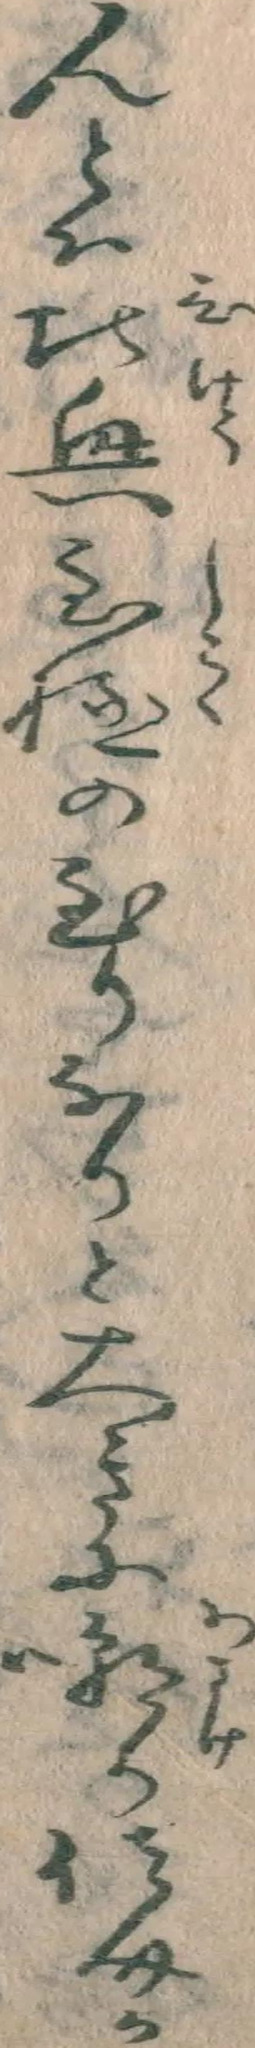んとは比興至極の至りなりと大きに嘲り佐介か
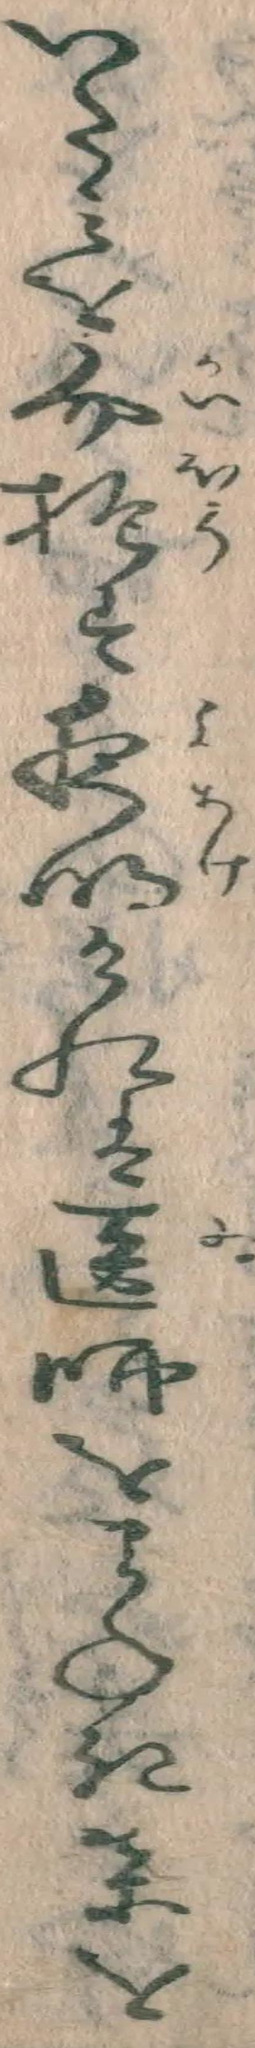いたみを介抱す夜明けれは医師をまねき薬を
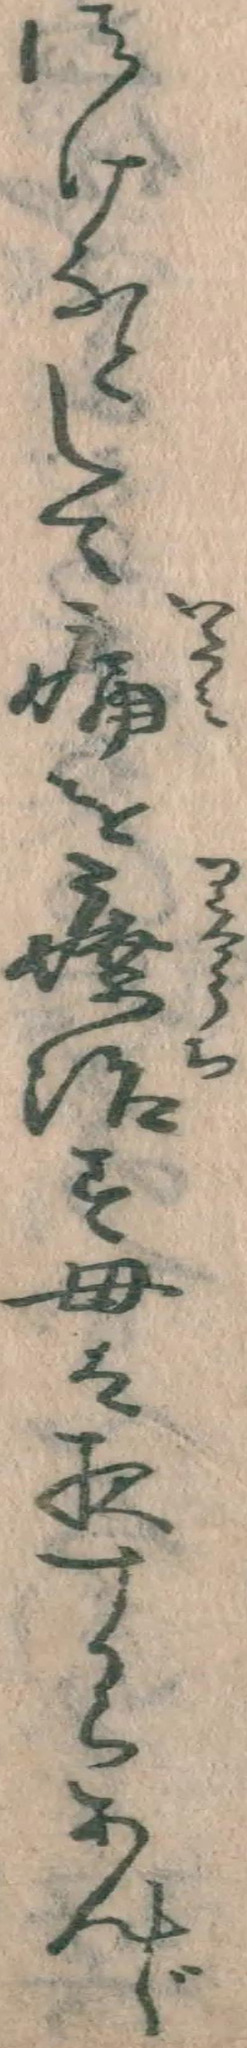つけなとして痛を療治す母は夜すからあんじ
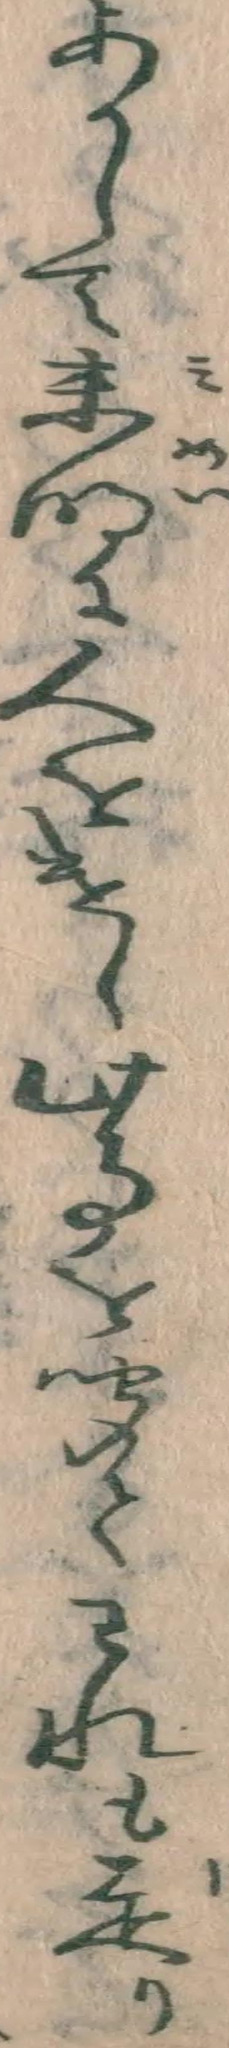あかして未明に人を遣し此事を聞てわれも走り
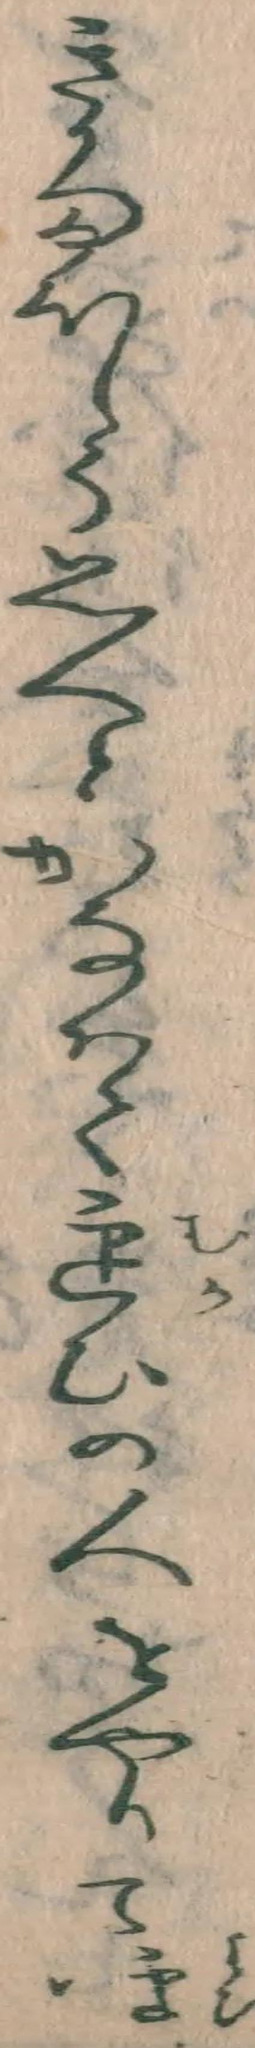きまほしう思へとかなはて迎ひの人をやりて呼
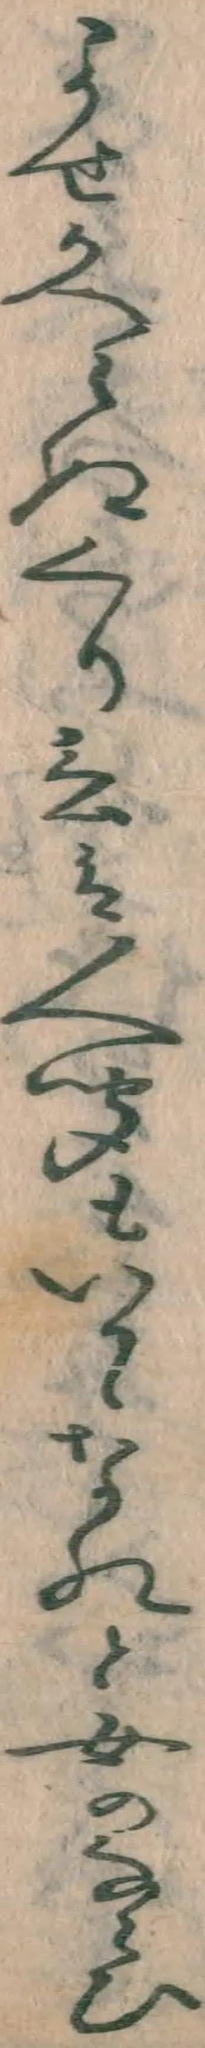よせかへらぬくり言は人聞もいかゝなれと女のならひ
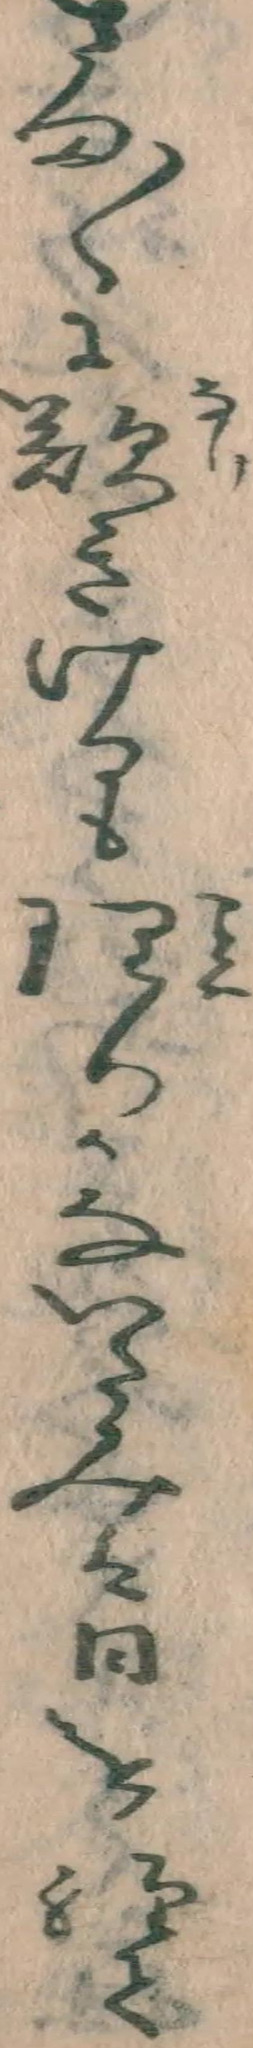さま〳〵に歎きけるも理りかないたみは日を経て
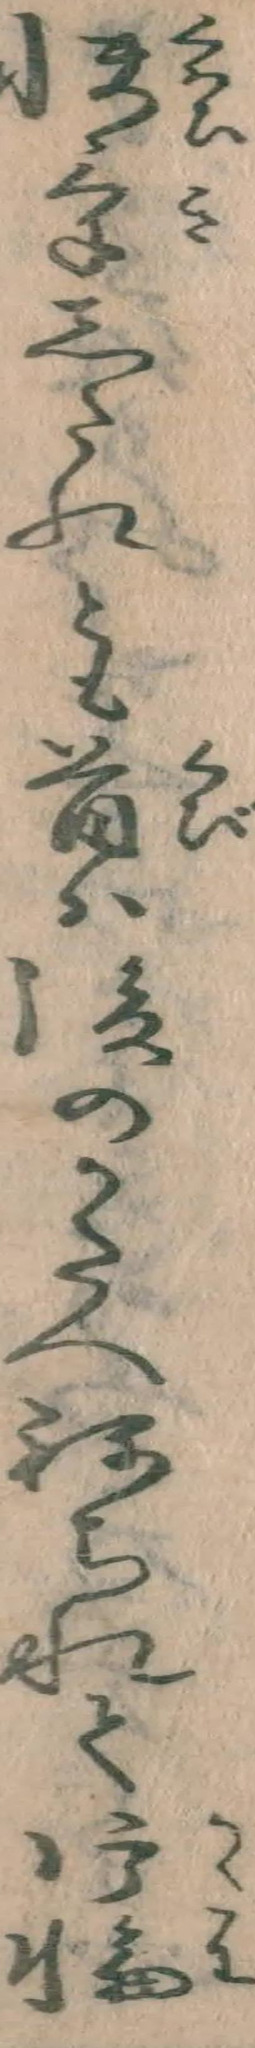快気したれとも首は後のかたへねちれて片輪
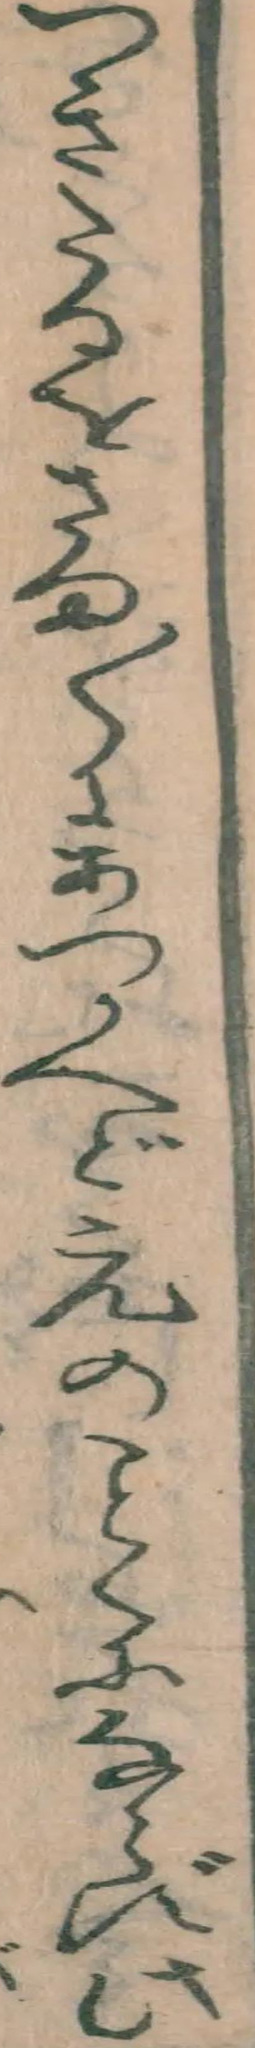つきたるをさま〳〵にあつかへど元のことくにならず此
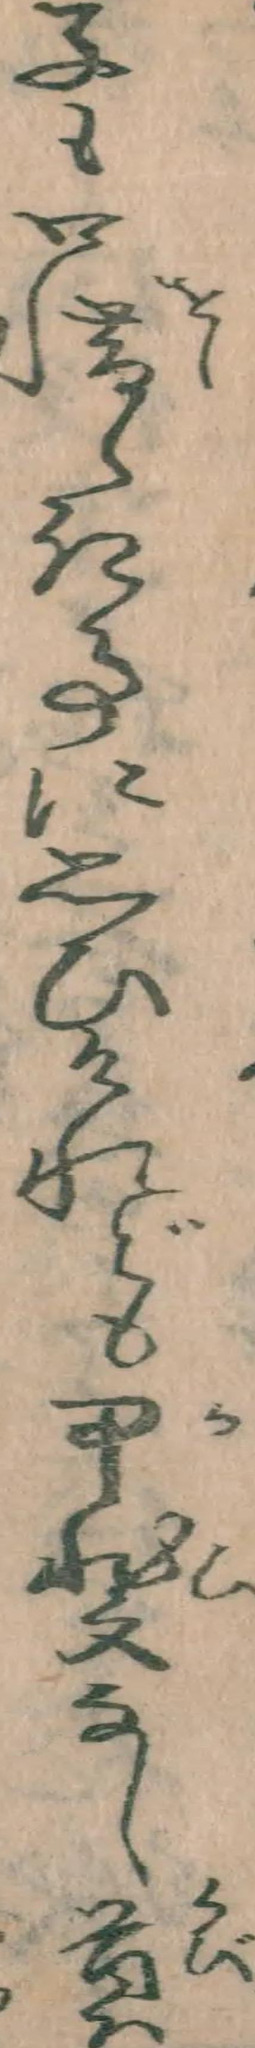子も口惜しき事に思ひけれども甲斐なし首は
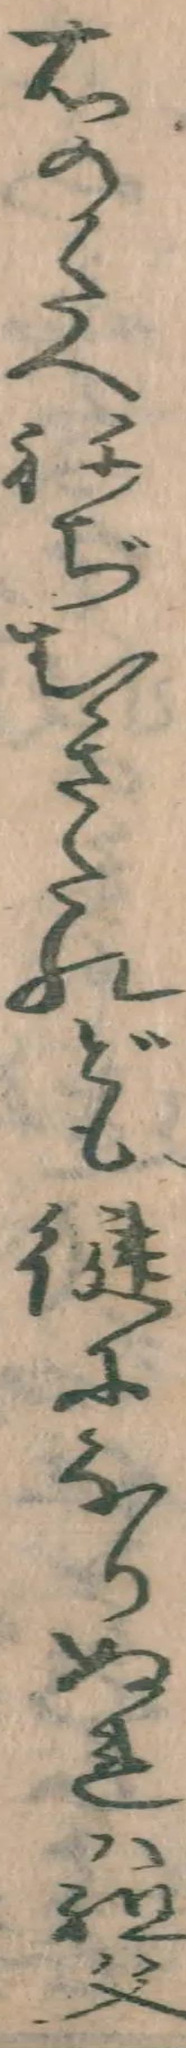右のかたへねぢむきたれども健になりぬれは祖父
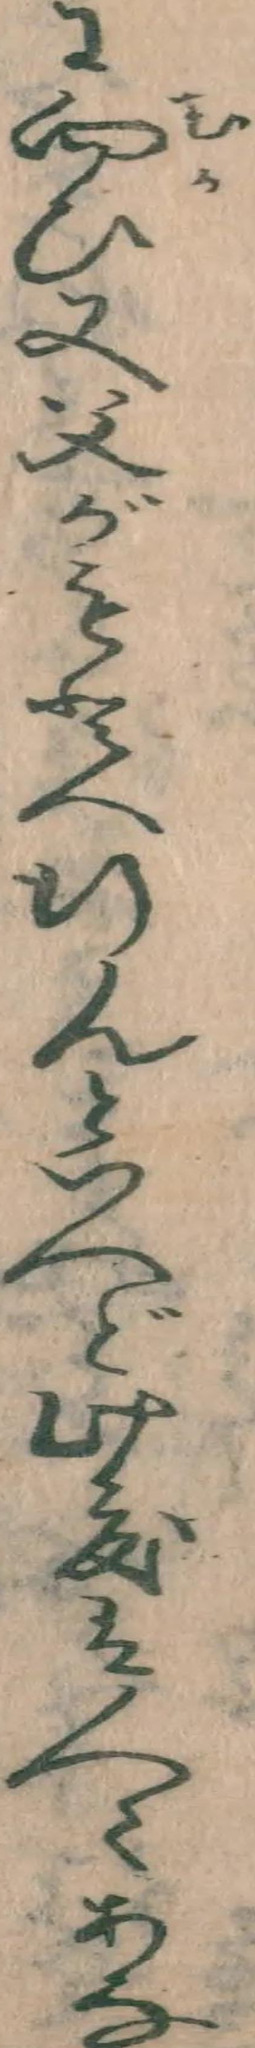に向ひ又父がもとへ行んといへど此度は人々あな
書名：怪談御伽童 5巻. [2]
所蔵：国立国会図書館 National Diet Library, JAPAN
